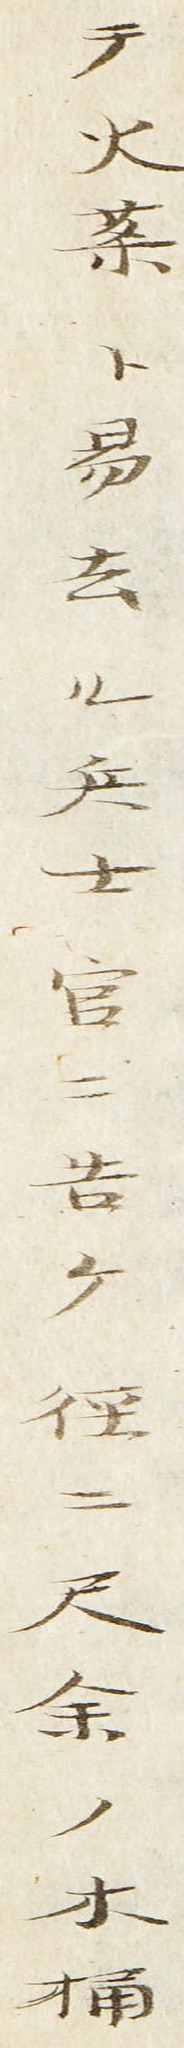テ火薬ト易去ル兵士官ニ告ケ径二尺余ノ木桶
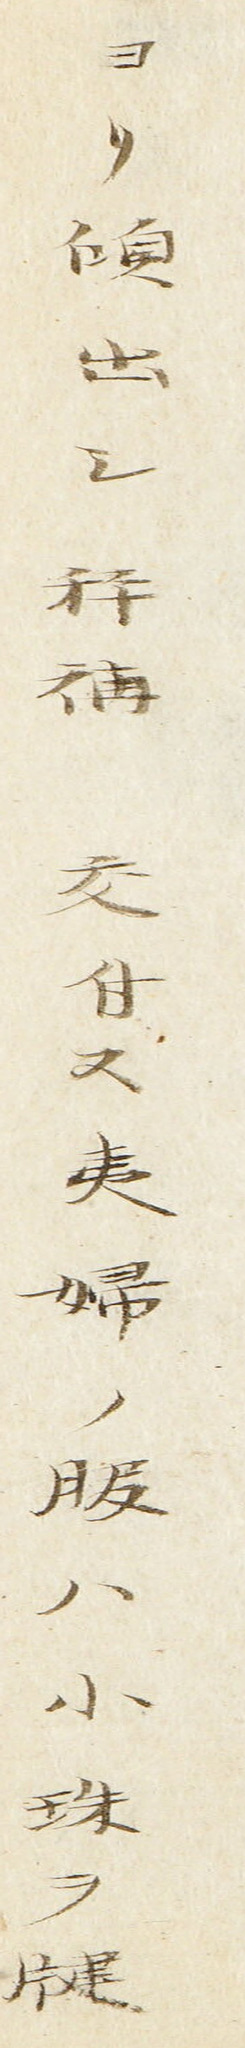ヨリ傾出シ秤交付ス夷婦ノ服ハ小珠ヲ

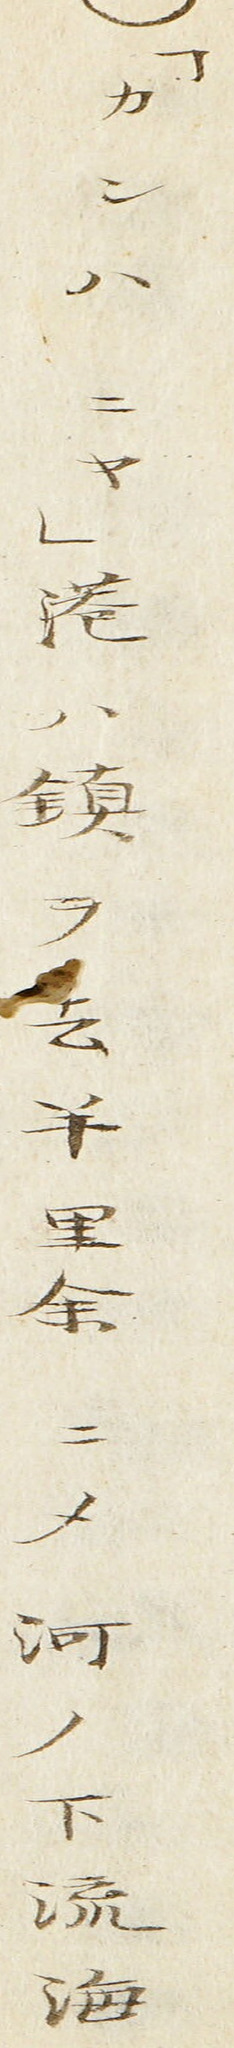○「カンハニヤ」港ハ鎮ヲ去半里余ニシテ河ノ下流海
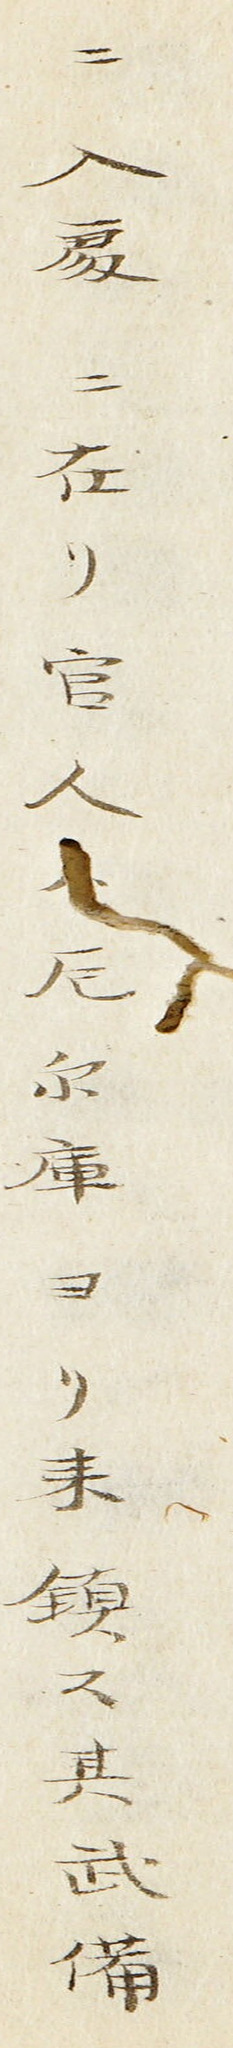ニ入処ニ在リ官人ハ厄尓庫ヨリ来鎮ス其武備
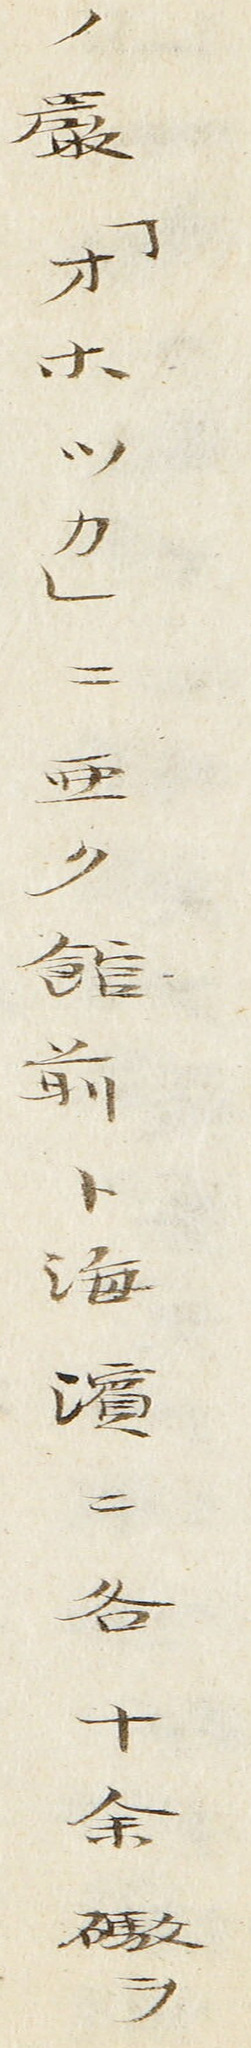ノ厳「オホツカ」ニ亜ク館前ト海浜ニ各十余礟ヲ
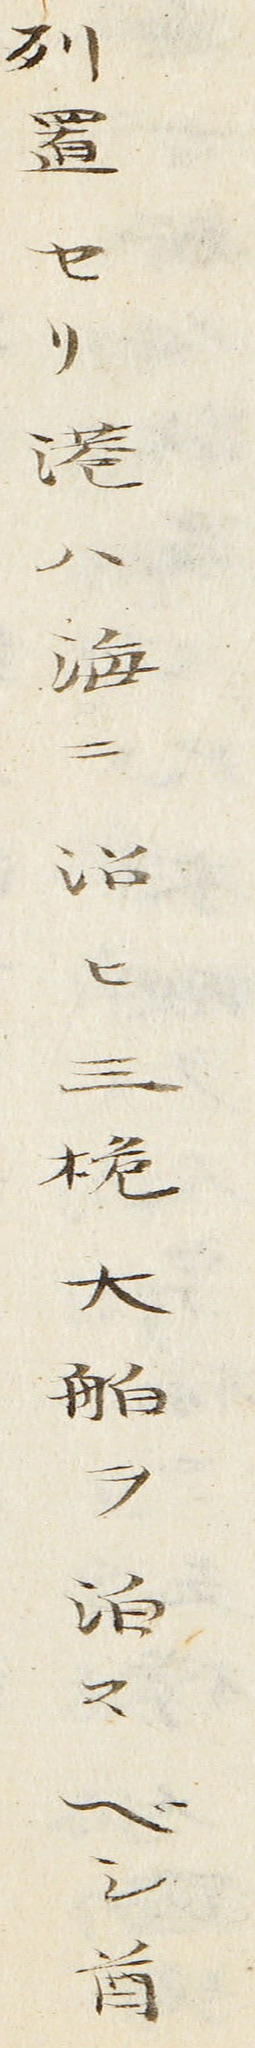列置セリ港ハ海ニ沿ヒ三桅大舶ヲ泊スベシ酋
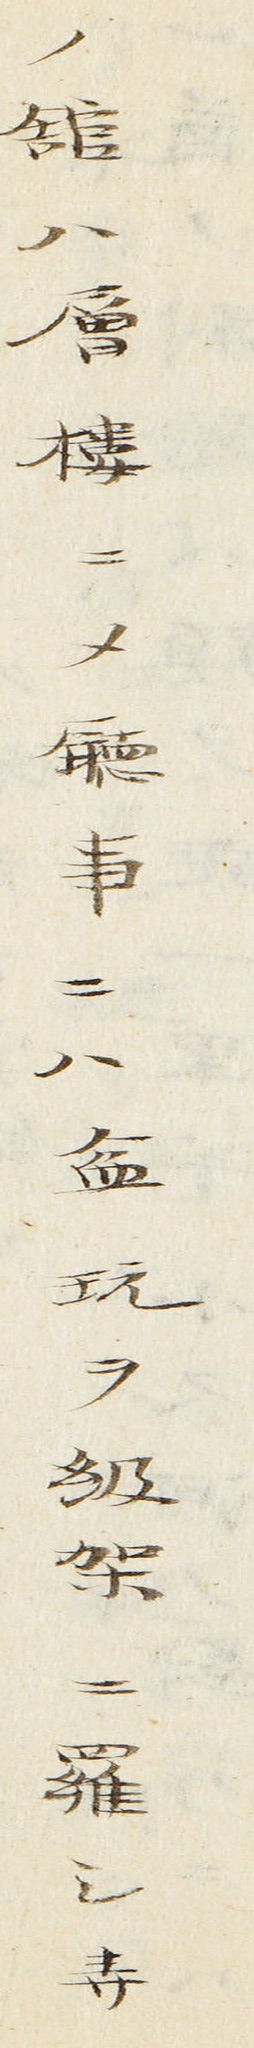ノ舘ハ層楼ニシテ庁事ニハ盆玩ヲ級架ニ羅シ寺
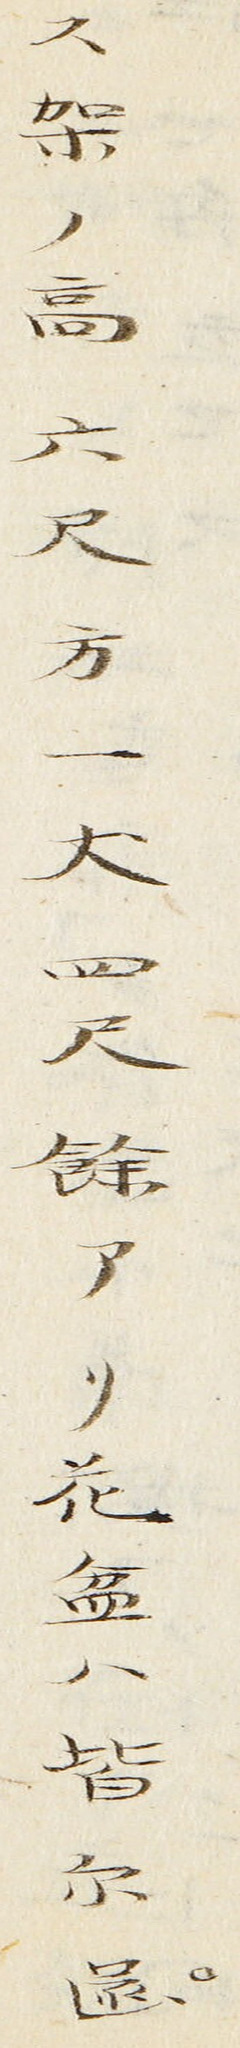ス架ノ高六尺方一丈四尺余アリ花盆皆尓
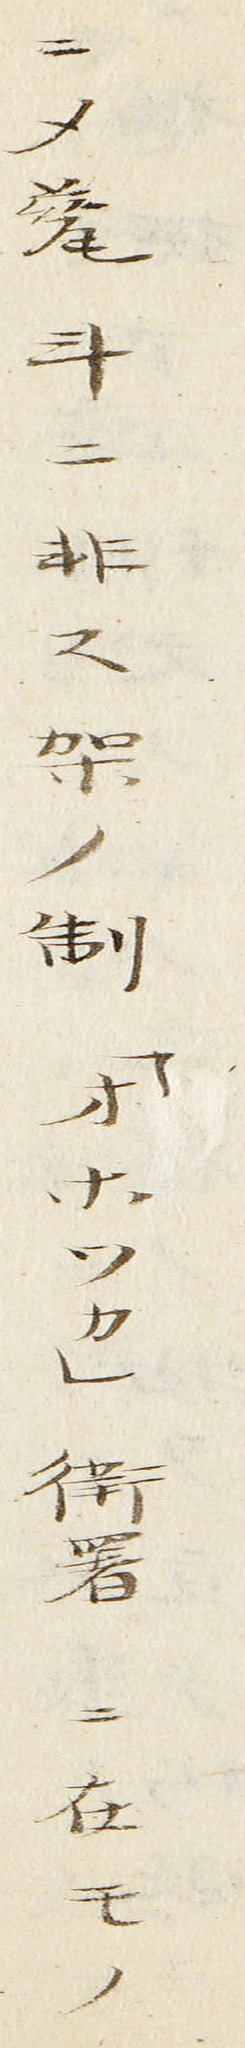ニシテ斗ニ非ス架ノ制「オホツカ」衛署ニ在モノ
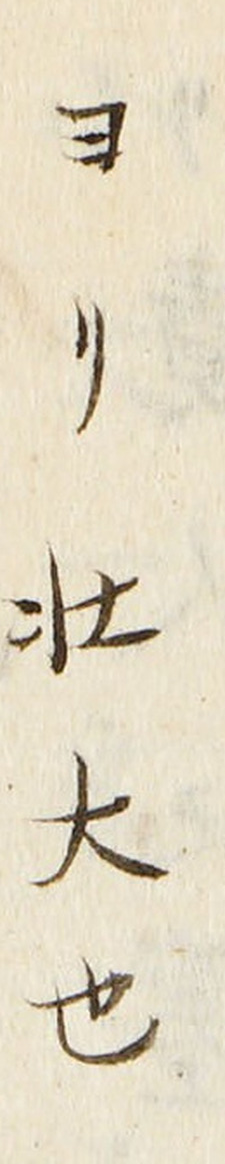ヨリ壮大也

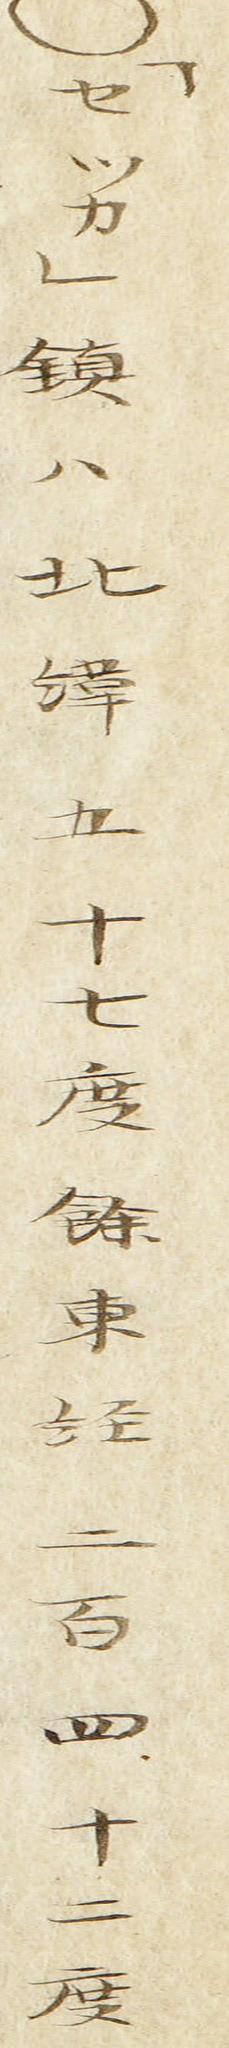○「セツカ」鎮ハ北緯五十七度余東経二百四十二度
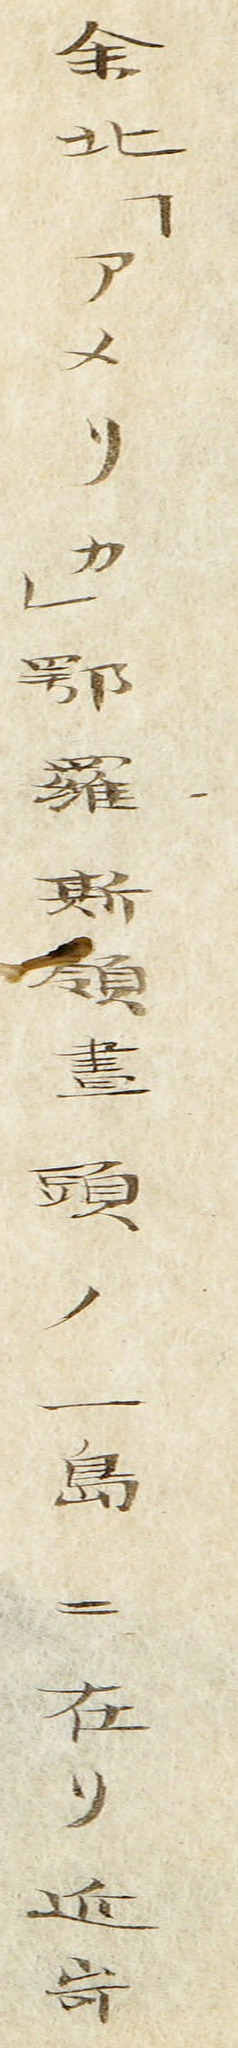余北「アメリカ」鄂羅斯領畫頭ノ一島ニ在リ近岢
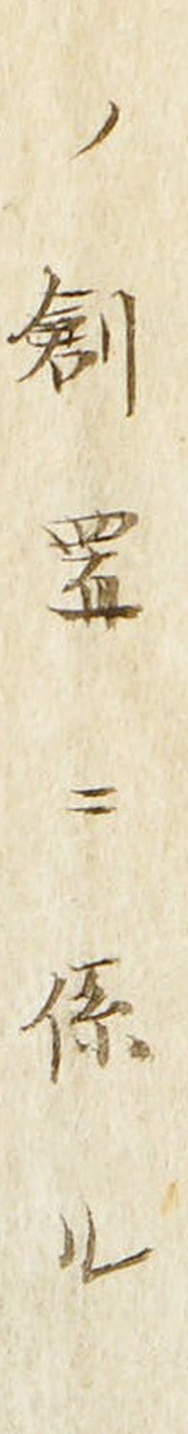ノ創置ニ係ル
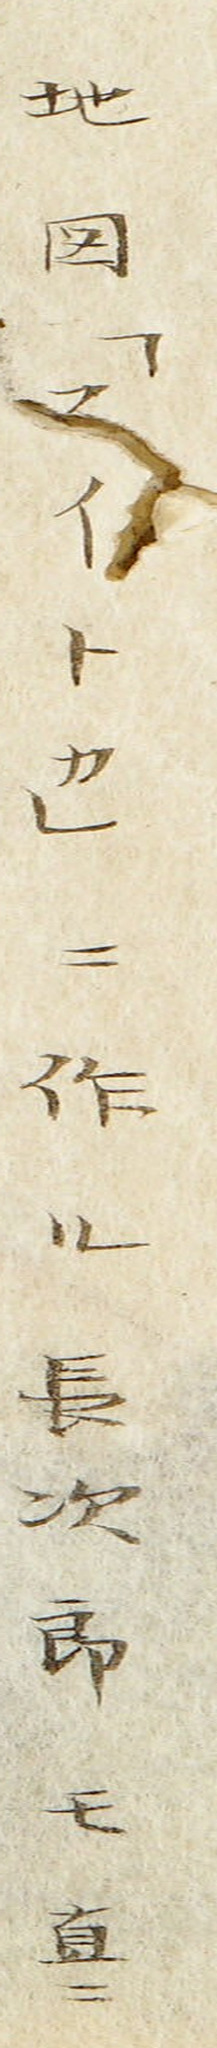地図「スイトカ」ニ作ル長次郎モ直ニ
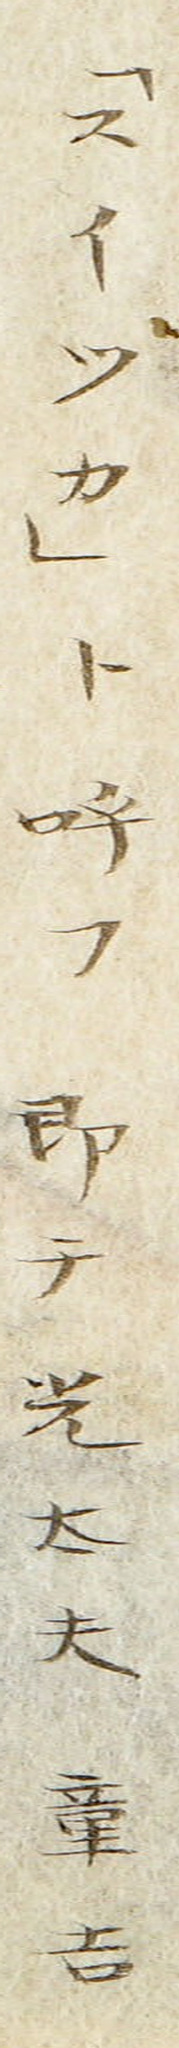「スイツカ」ト呼フ即チ光太夫童吉
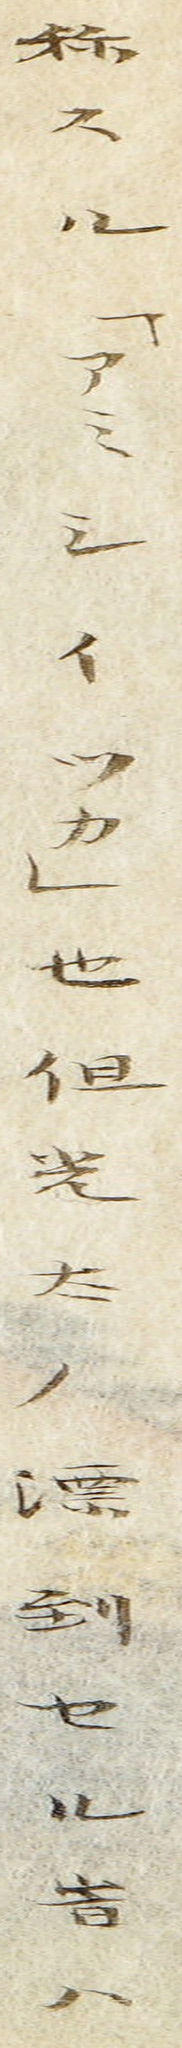称スル「アミシイツカ」也但光太ノ漂到セル旹ハ
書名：流蕃通書
